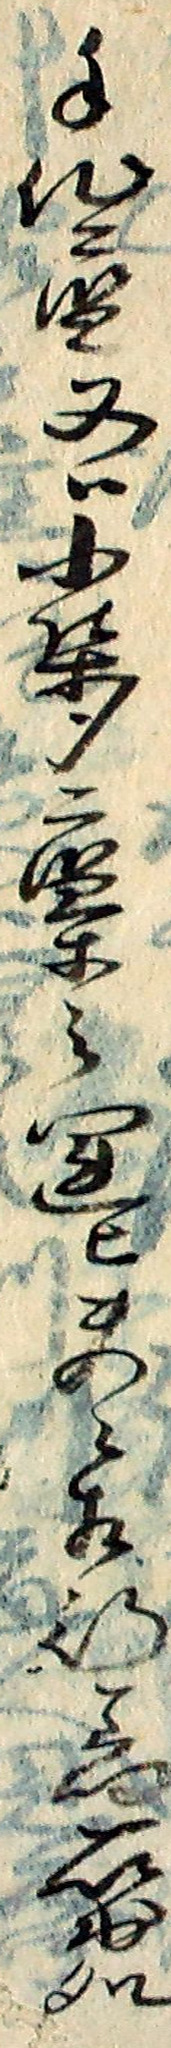手作藍又は小葉〆藍等之運ひ夫々相行着右出処
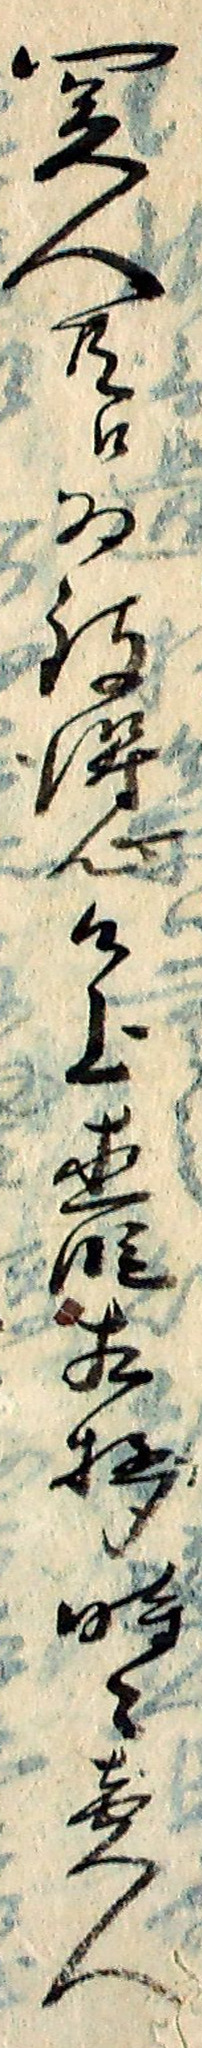買人共え為致得心候上直段相極め時々売人
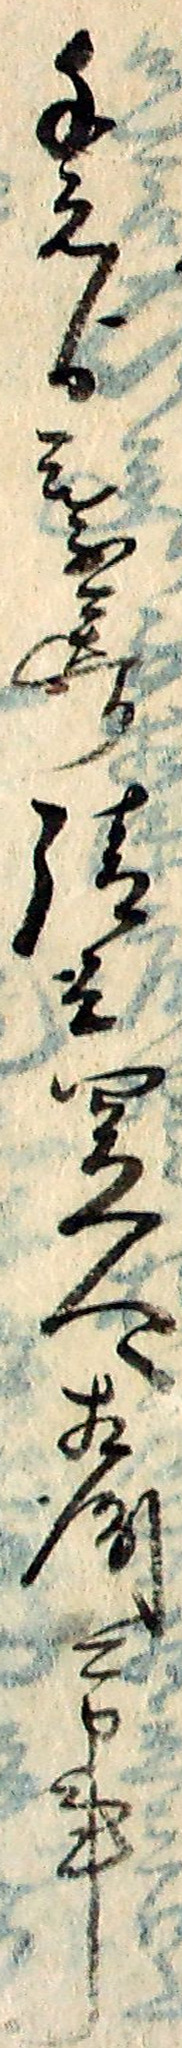手元ゟ葉送り請取買人へ相渡し可申事

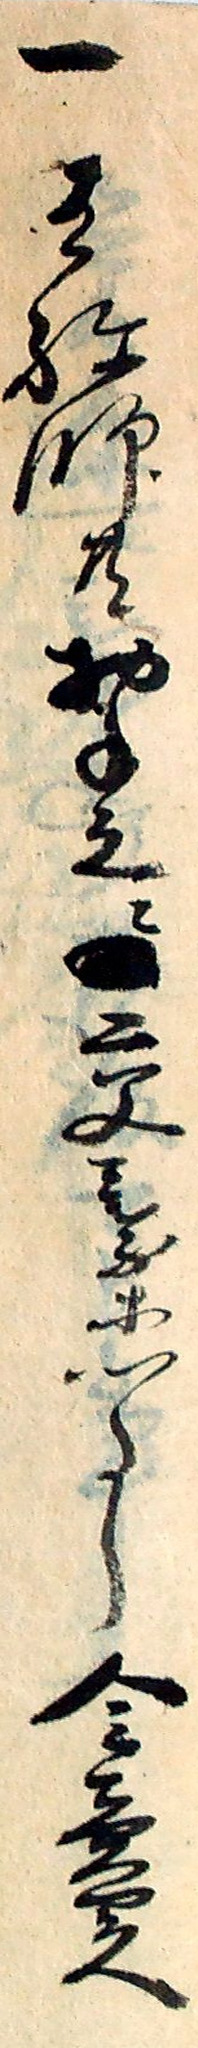一はね師共物手元に交葉等いたし令売買
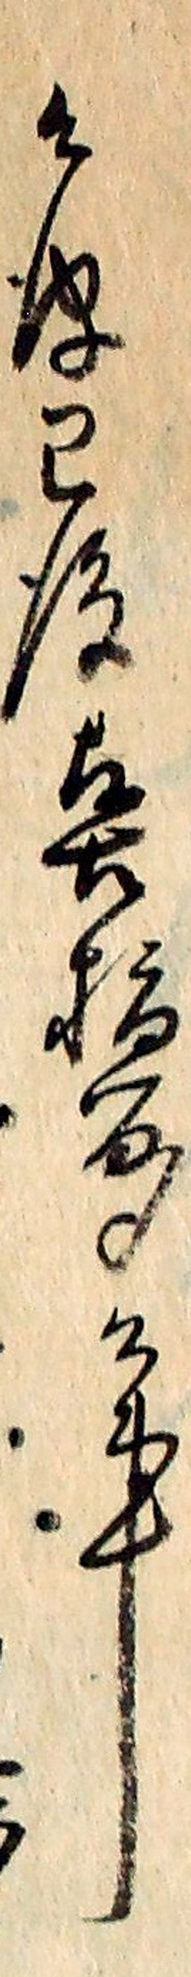候儀已後堅指留め候事
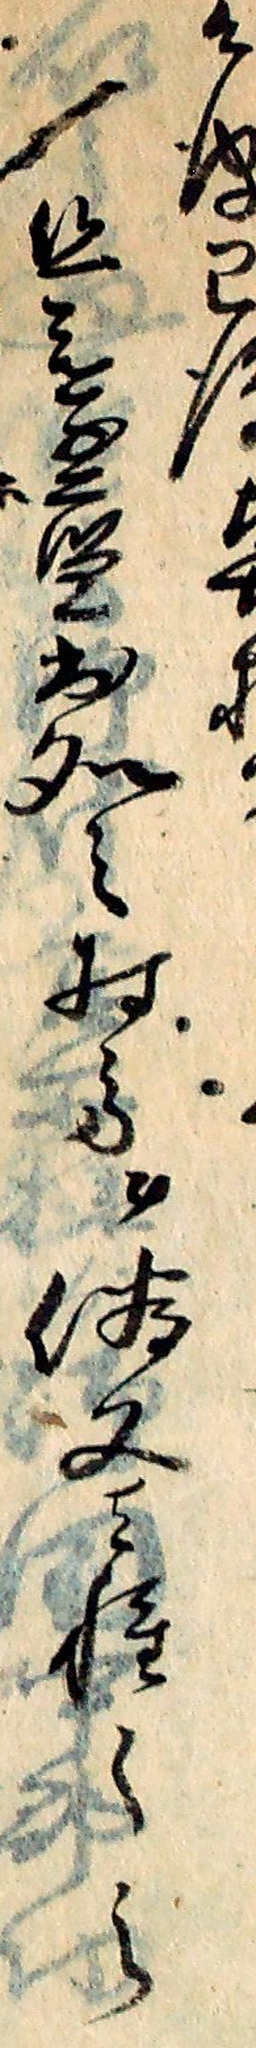但葉藍出処之村方を偽又は種々之
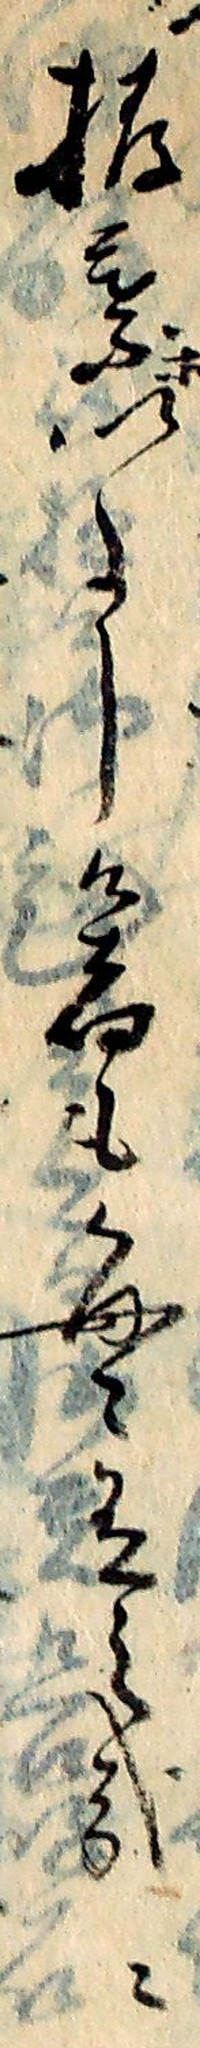拵葉等いたし候者も毎々有之哉に
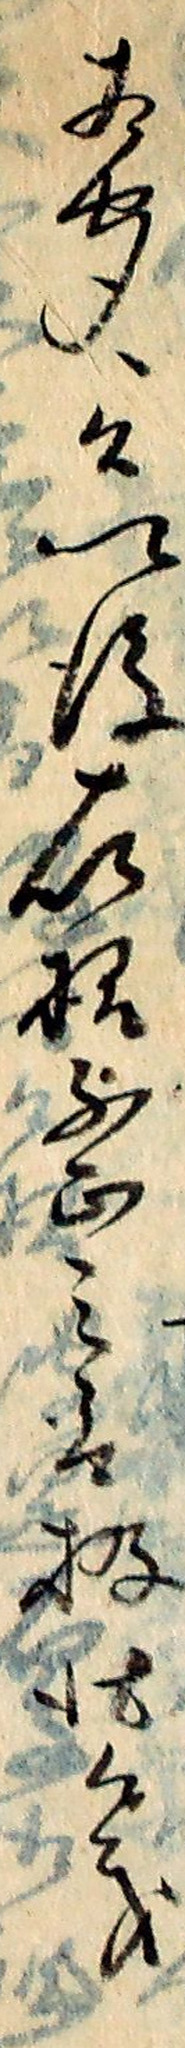相聞へ候以後右様不正之取扱仕候義
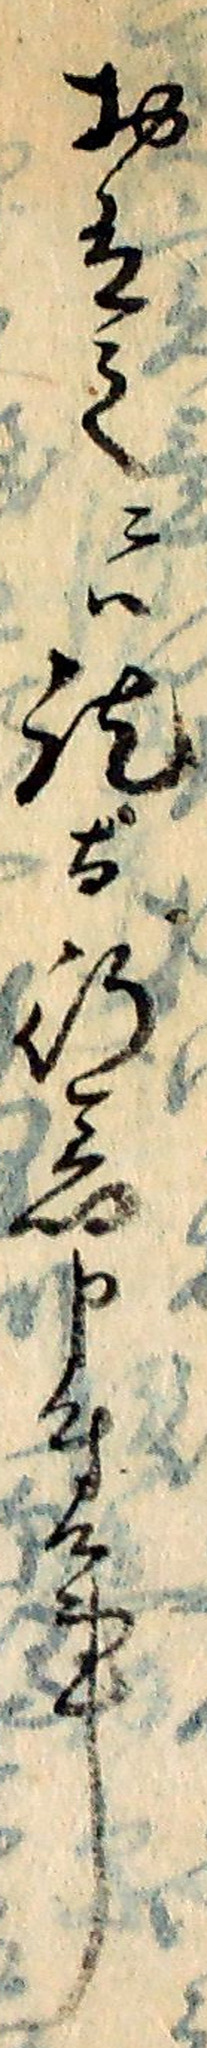於有之ては然と行着申付候事
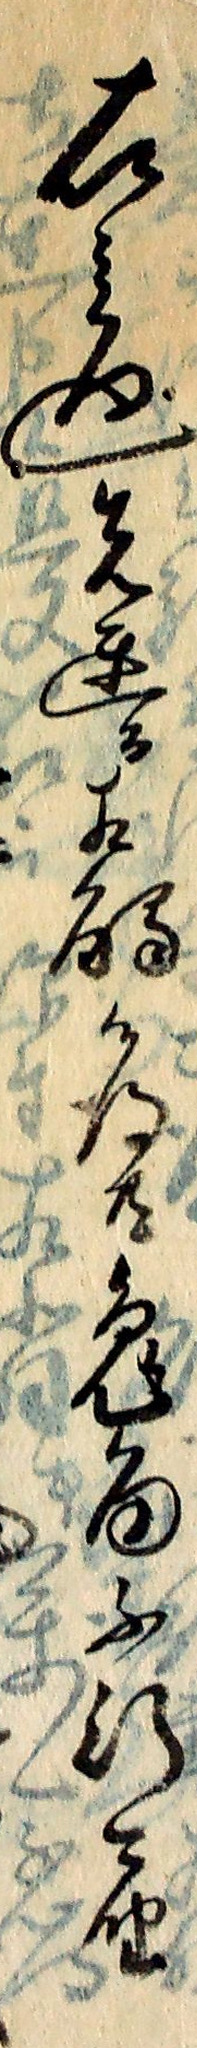右之通先達て相触候得共兎角不行届
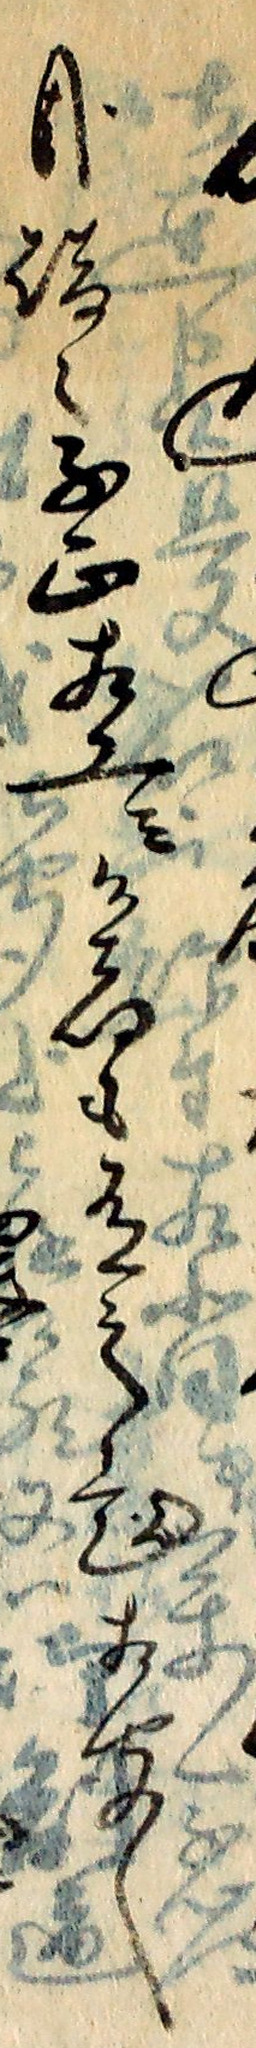哉端々不正相工み候者も有之趣相聞へ
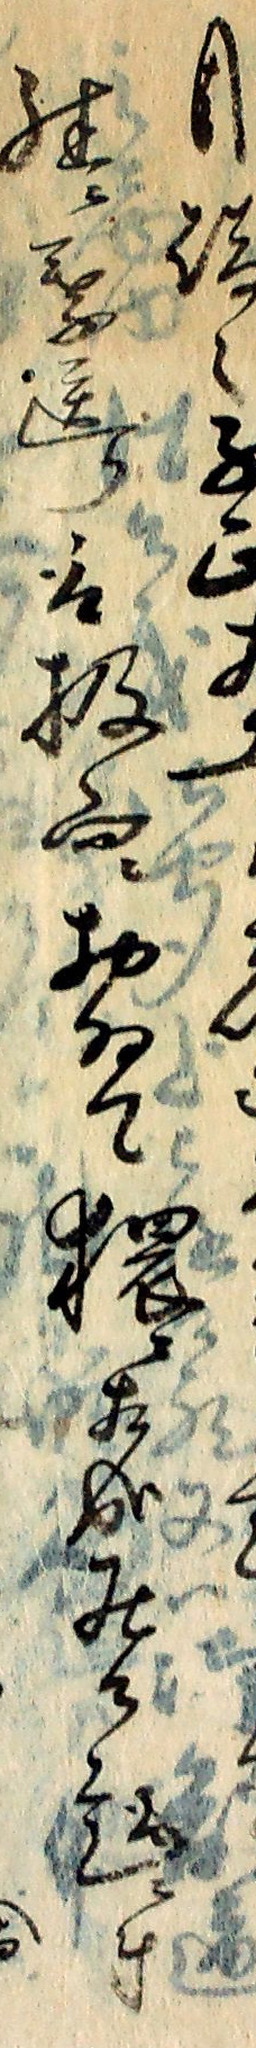殊に葉送り取扱向におゐて猥に相成居候趣に付
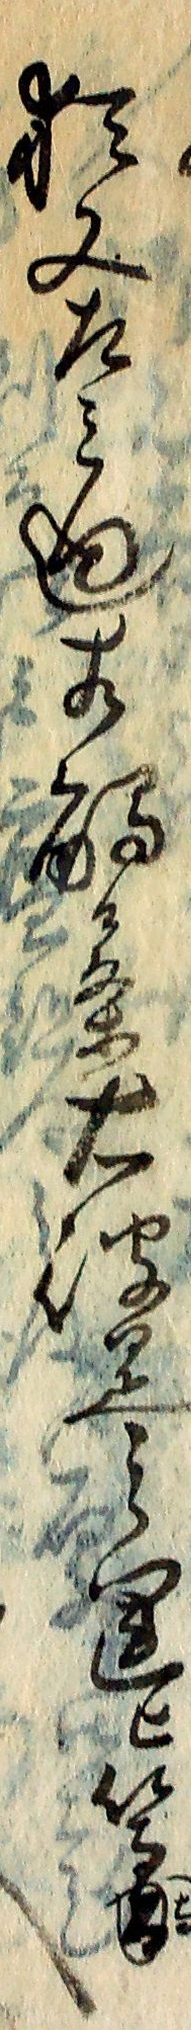猶又左之通相触候条右彼是之運ひ篤と
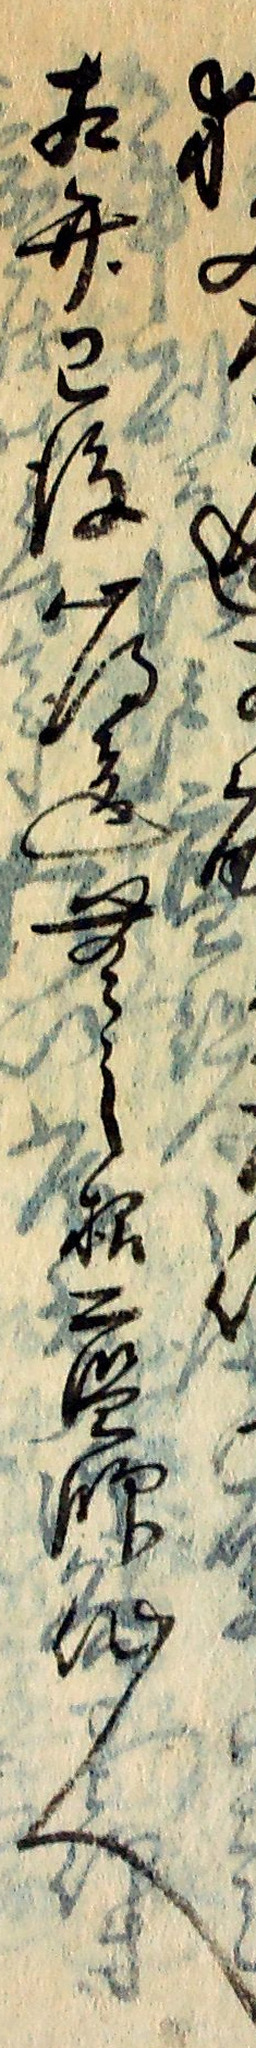相弁已後心得違無之様藍師作人
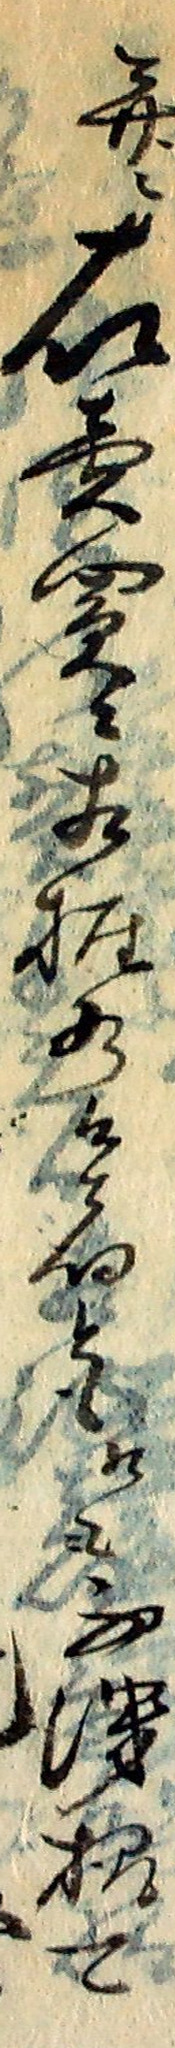并に右売買に相携候者ともえも不洩様可
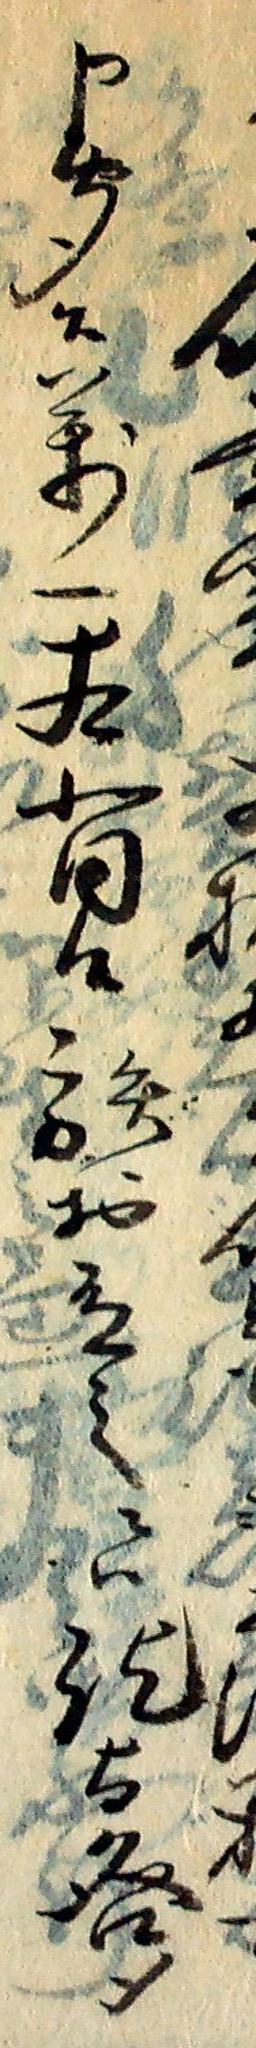申聞候万一相背候族於有之ては然と咎め
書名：諸御願書控(後藤氏壱番）
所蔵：鳴門教育大学 Naruto University of Education
